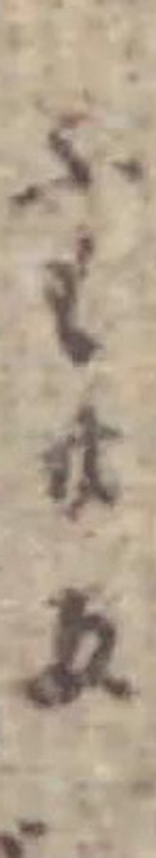ふも廿両
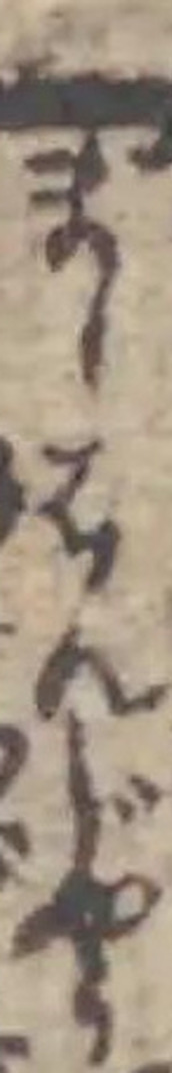ましはんじやう
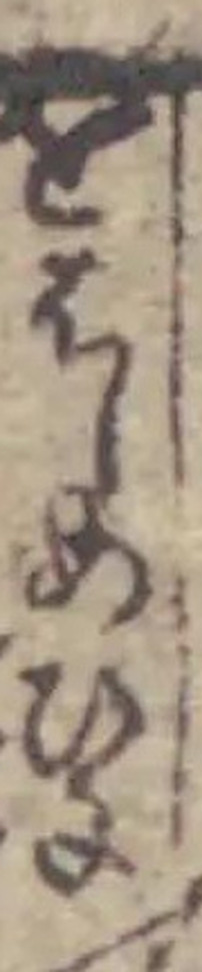をはしめひに
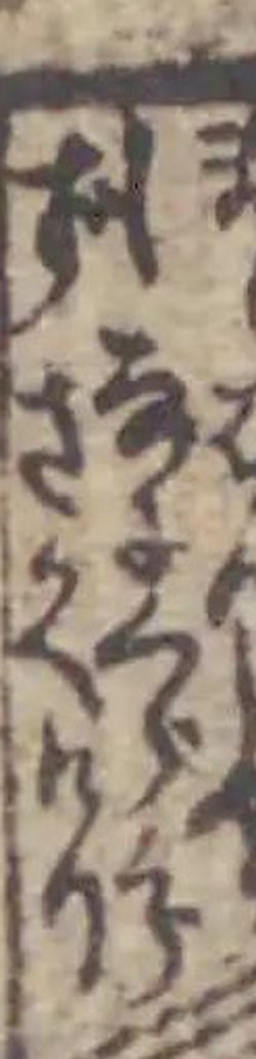ずさかへけり
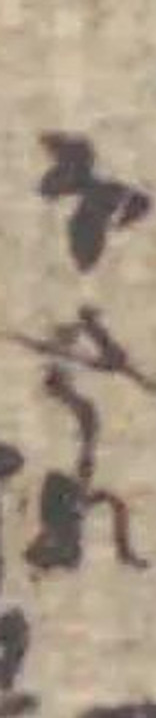なされ
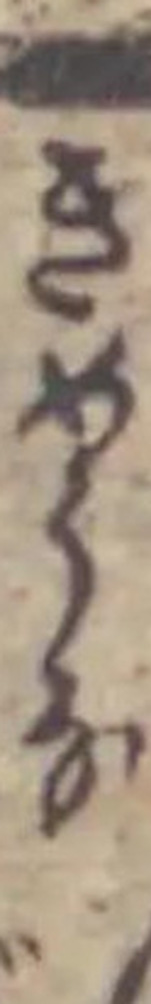きめうな
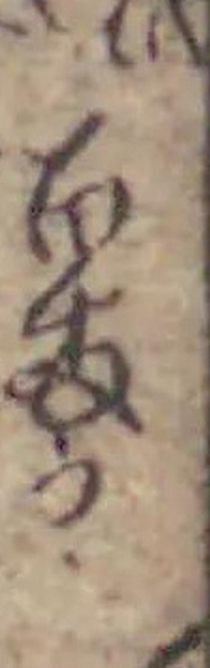百両か
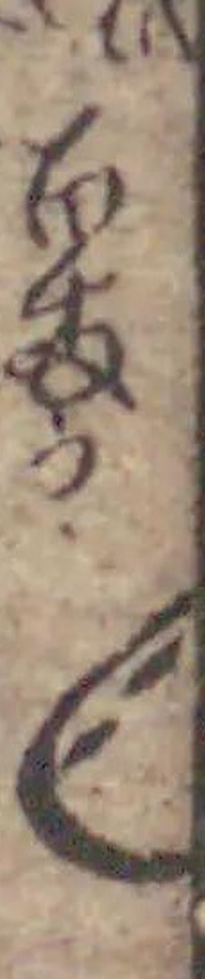百両か
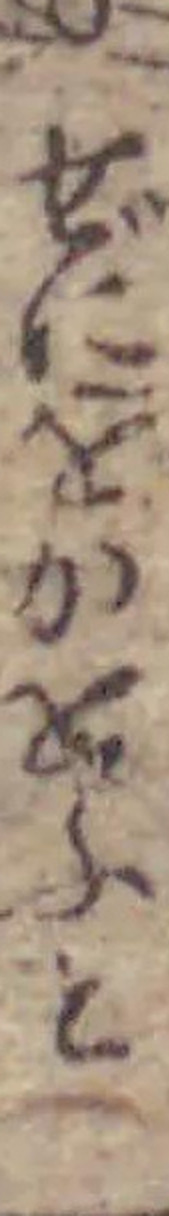ぜにをかをふと
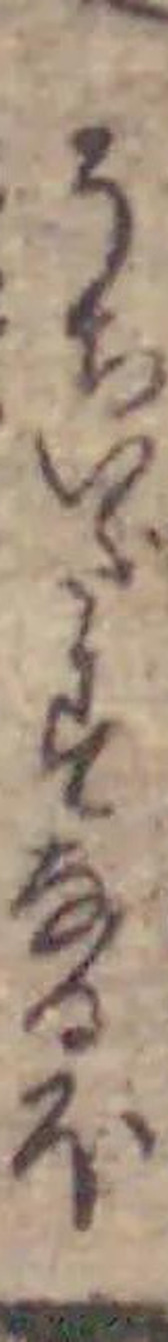うちいだすなるほ
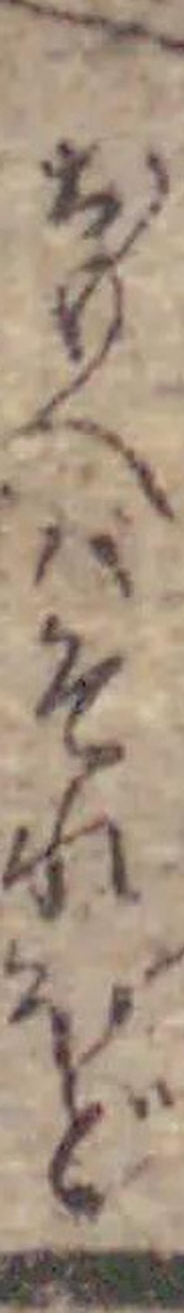おもへはそれほど
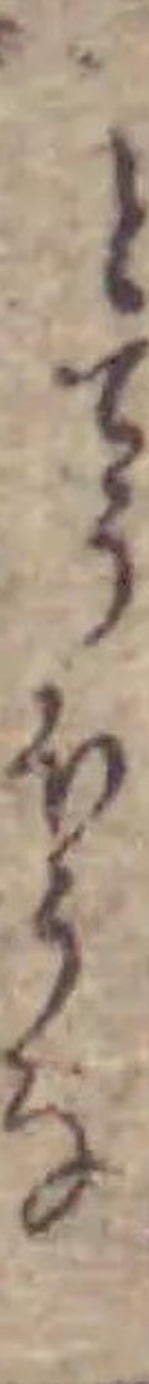とてうほうな
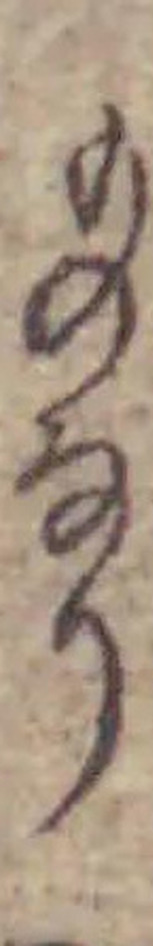ものなり
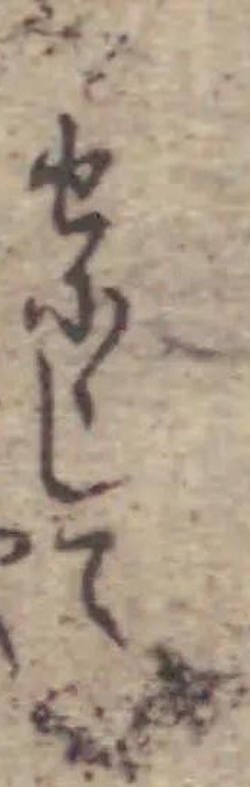せにゝして
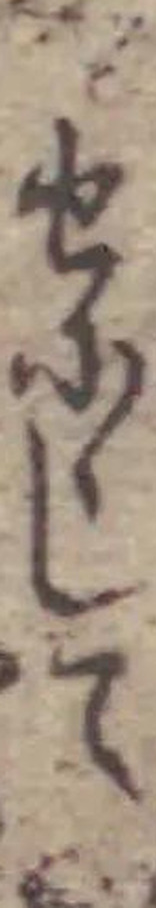せにゝして
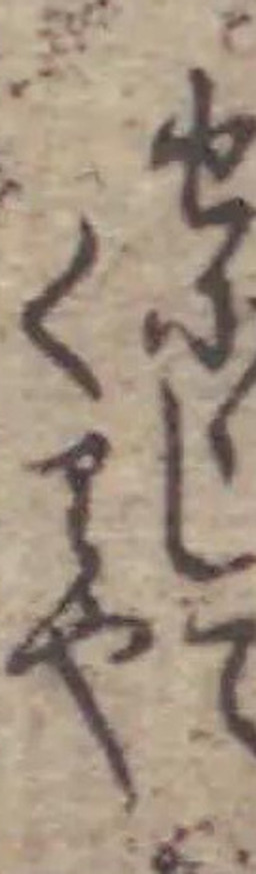くりや
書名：日待御利生此ごろ噂 3巻
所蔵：国立国会図書館 National Diet Library, JAPAN
